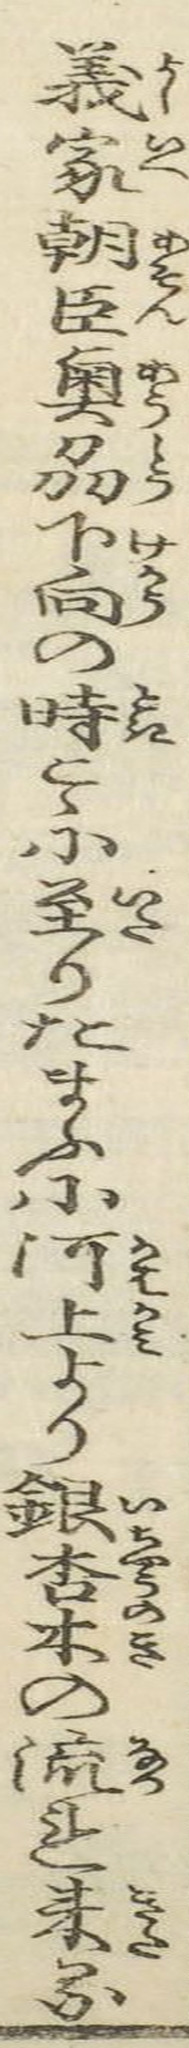義家朝臣奥州下向の時こゝに至りたまふに河上より銀杏木の流れ来る
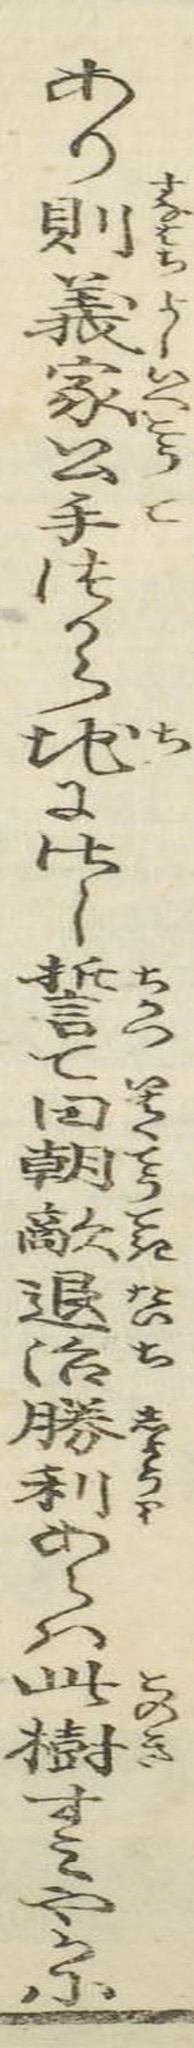あり則義家公手つから地にさし誓て曰朝敵退治勝利あらは此樹すみやかに
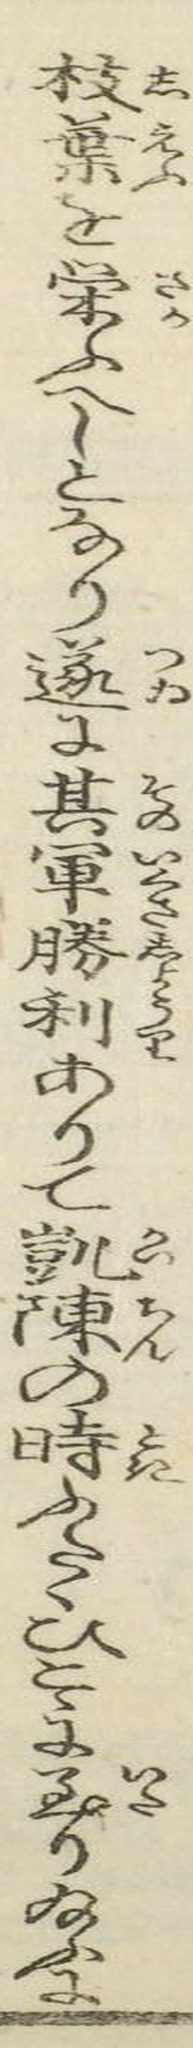枝葉を栄ふへしとなり遂に其軍勝利ありて凱陳の時ふたゝひこゝに至り給ふに
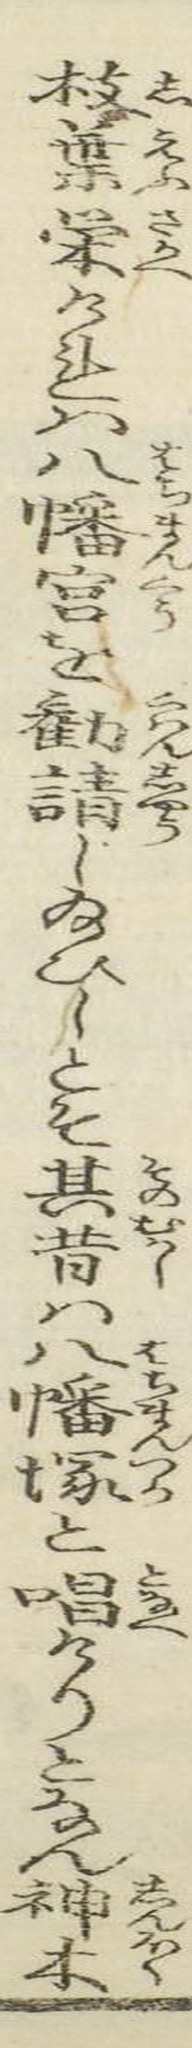枝葉栄けれは八幡宮を勧請し給ひしとそ其昔は八幡塚と唱けりとなん神木
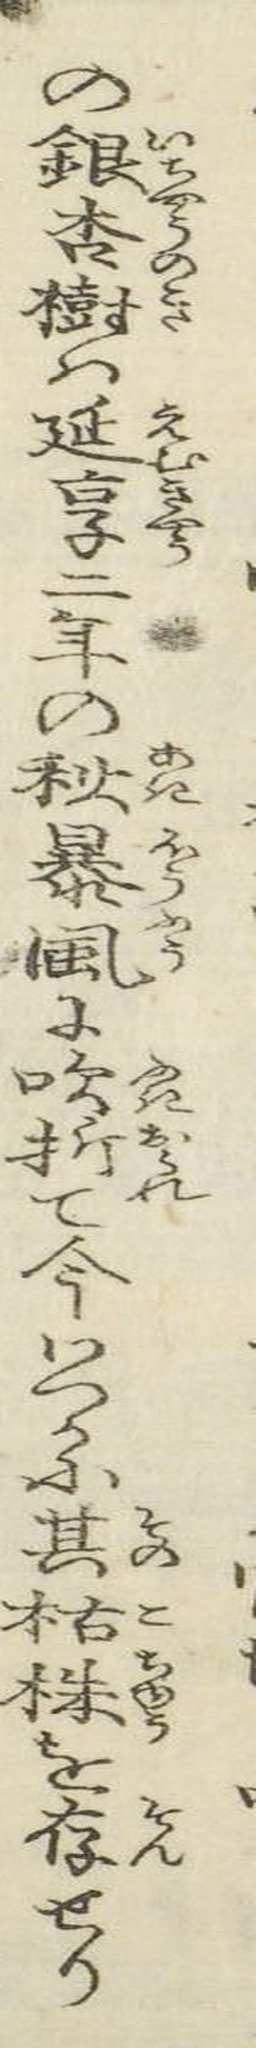の銀杏樹は延享二年の秋暴風に吹折て今わつかに其枯株を存せり
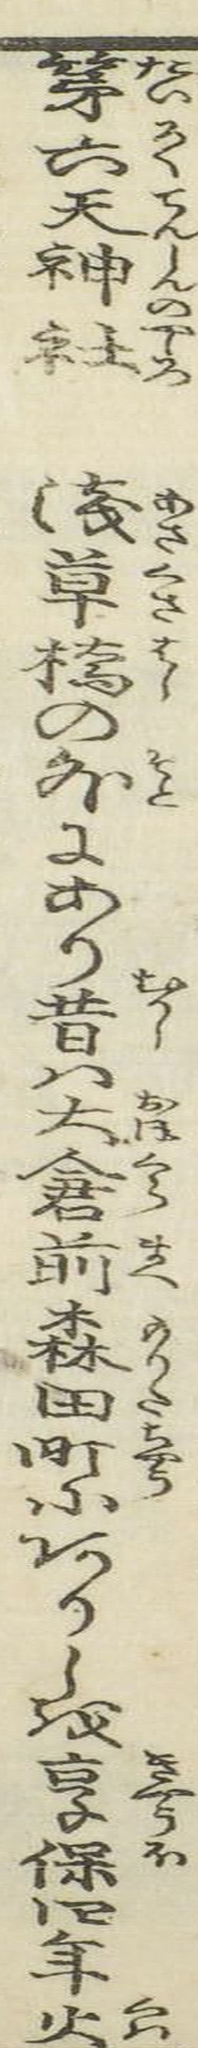第六天神社浅草橋の外にあり昔は大倉前森田町にありしを享保四年火
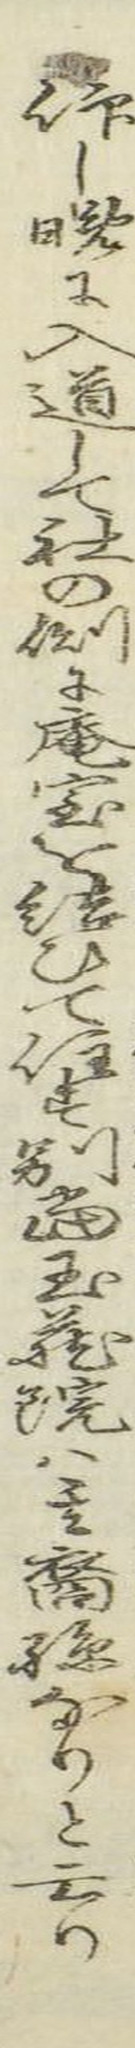仰し晩に入道して社の側に庵室を結ひて住す別当玉蔵院は其裔孫なりと云り
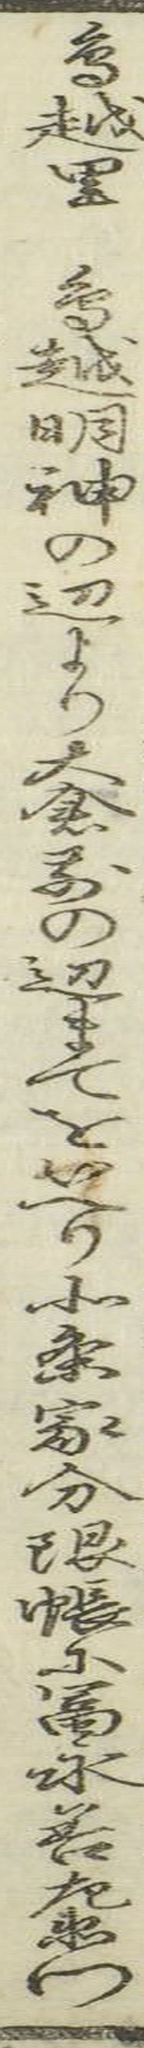鳥越里鳥越明神の辺より大倉前の辺まてをいへり北条家分限帳に冨永善左衛門
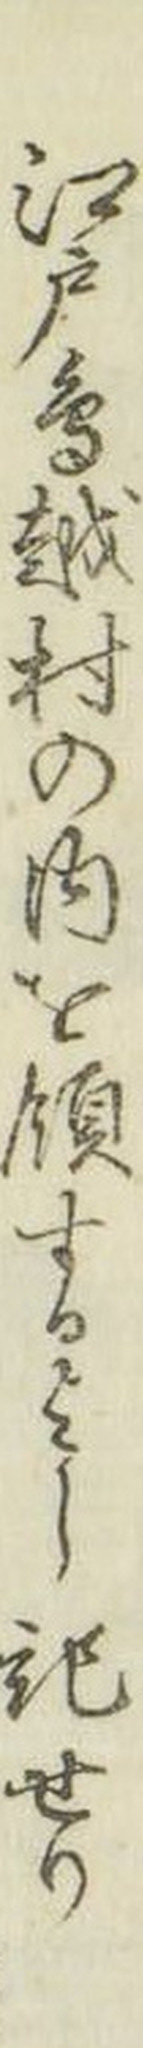江戸鳥越村の内を領するよし記せり
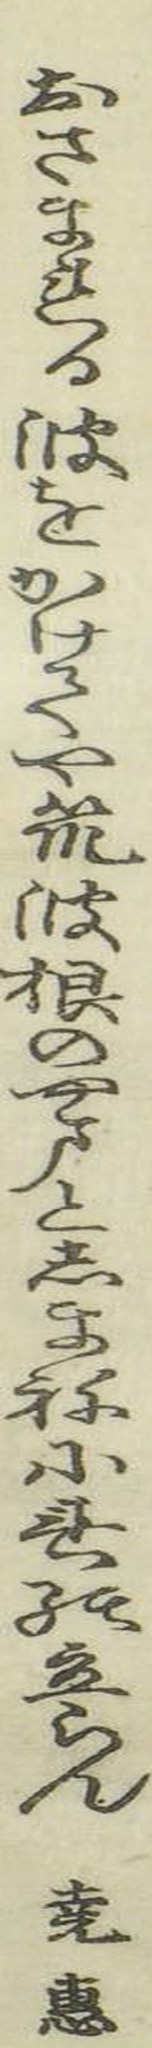おさまれる波をかけてや筑波根のやまとしまねに春の立らん尭恵

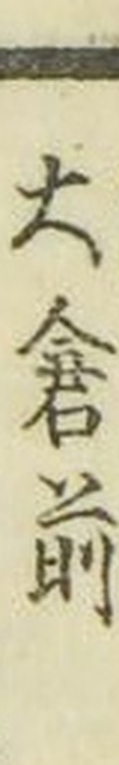大倉前
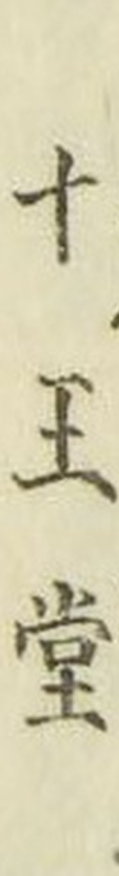十王堂
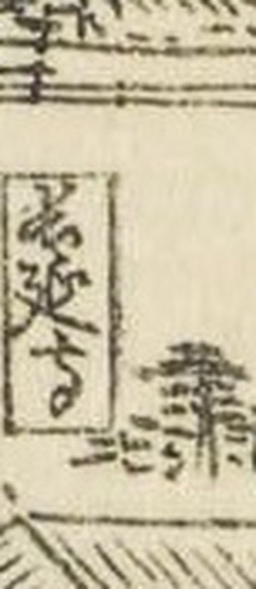長延寺
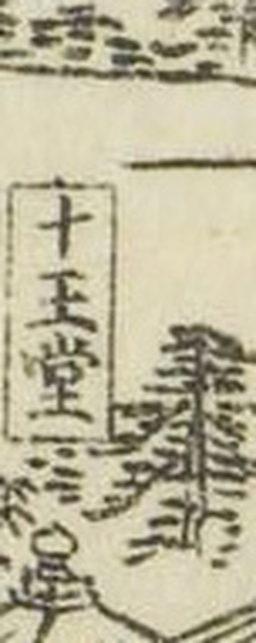十王堂
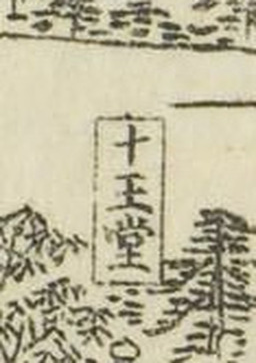十王堂

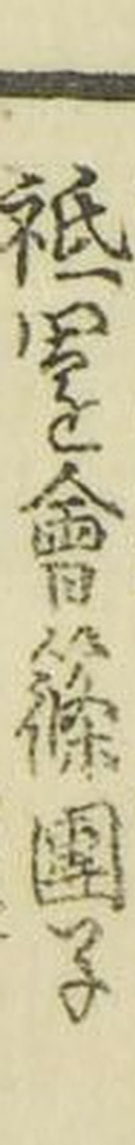祗園会篠団子
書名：江戸名所図会 20巻 巻之16
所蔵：東京学芸大学教育コンテンツアーカイブ
